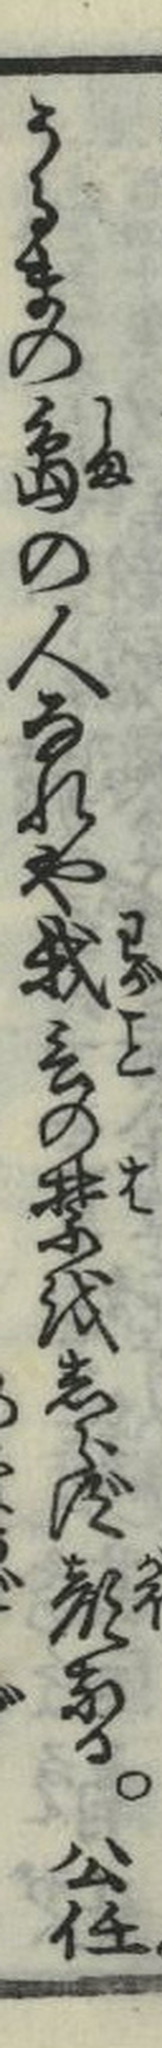うるまの島の人なれや我言の葉をしらず顔なる。
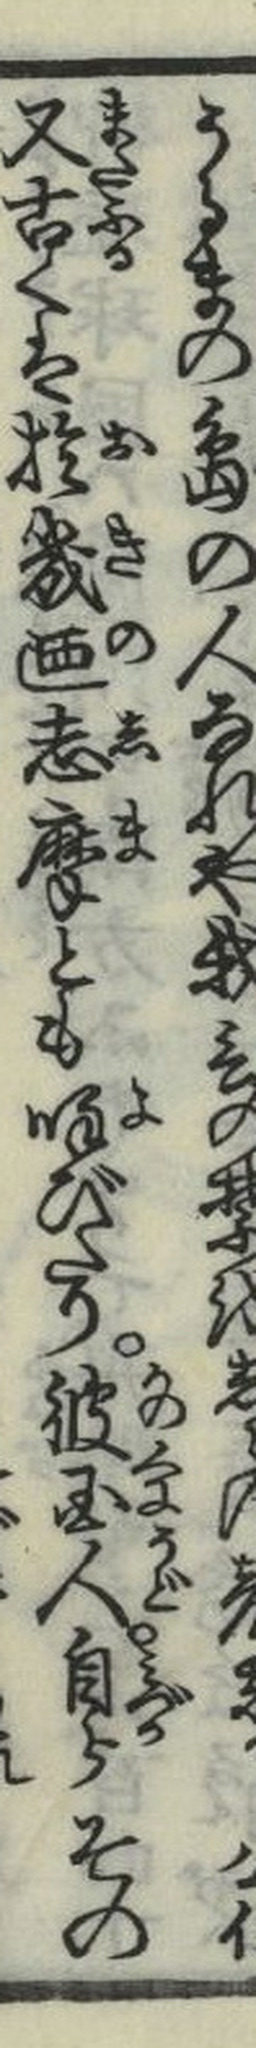又古くは於幾廼志摩とも呼びたり。彼国人。自らその
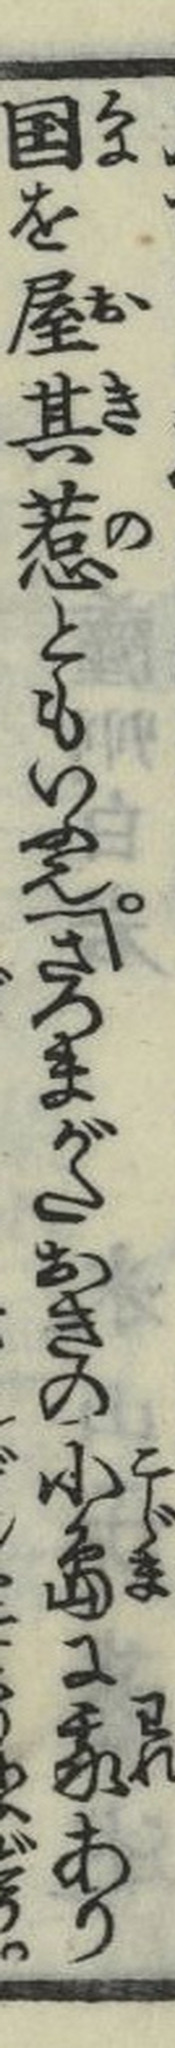国を屋其惹ともいふ也。〽さつまがたおきの小島に我あり
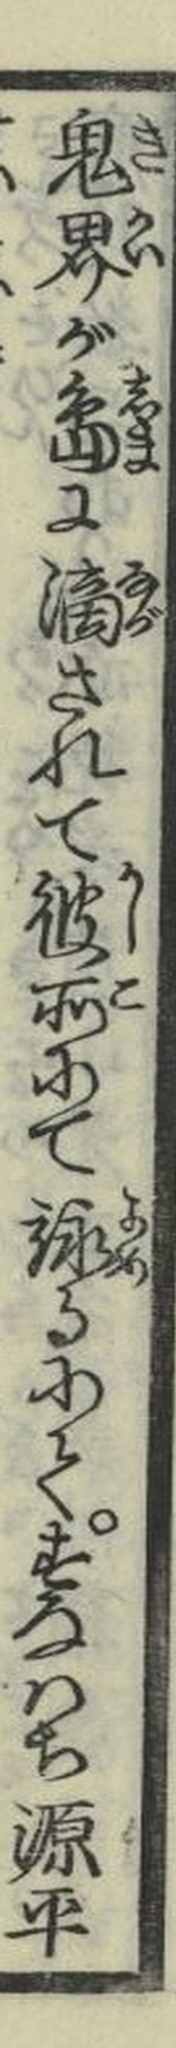鬼界が島に滴されて彼所にて詠るにて。すなハち源平
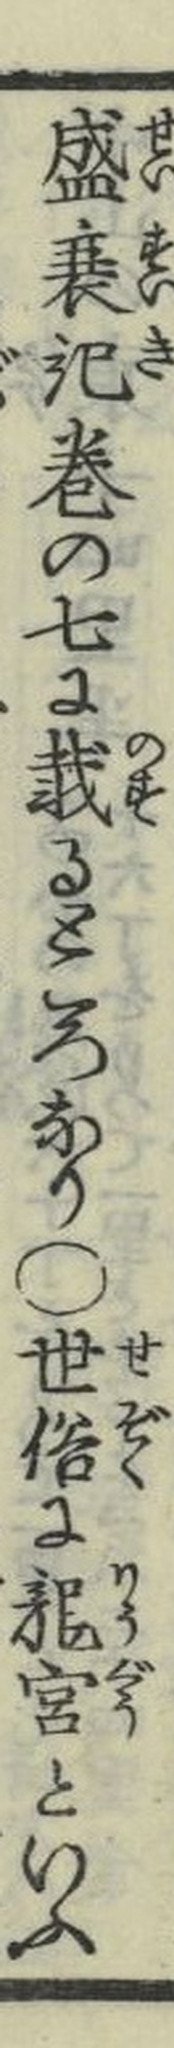盛衰記巻の七に載るところなり〇世俗に龍宮といふ
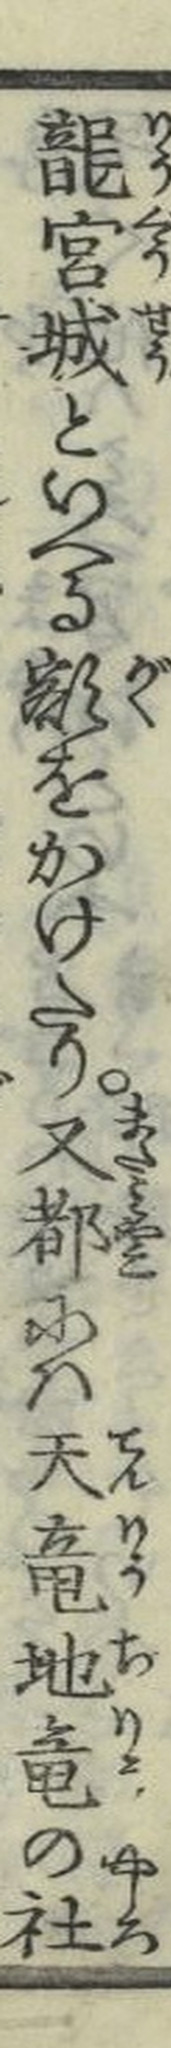龍宮城といへる額をかけたり。又都にハ天竜地竜の社
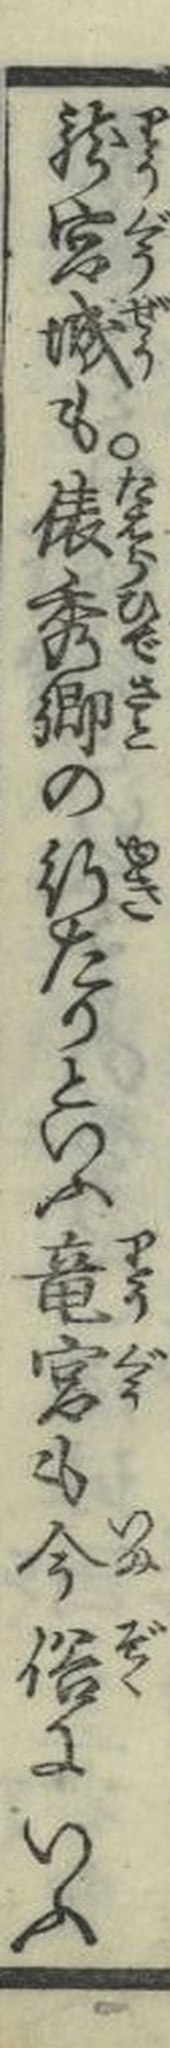龍宮城も。俵秀郷の行たりといふ竜宮も今俗にいふ

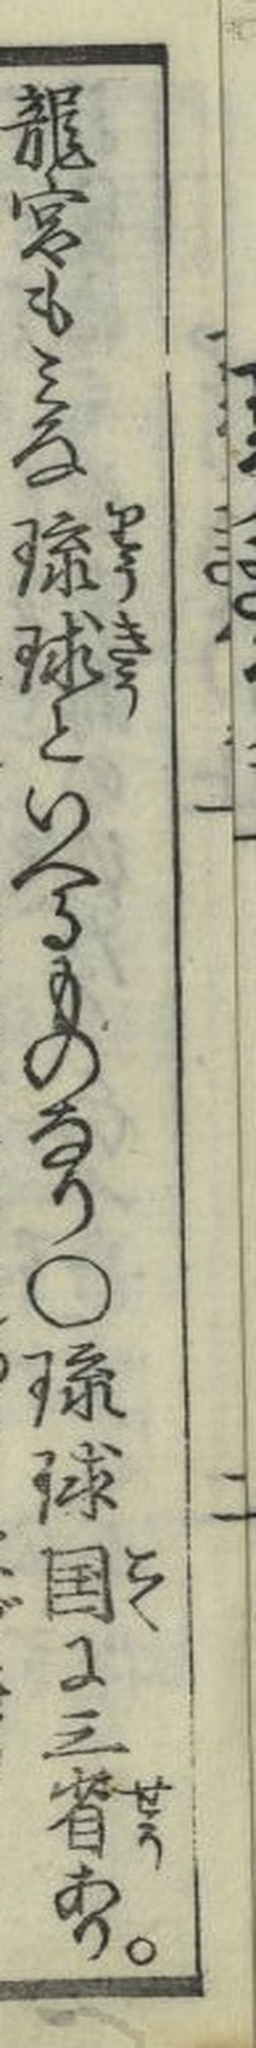龍宮もミな琉球といへるものなり〇琉球国に三省あり。
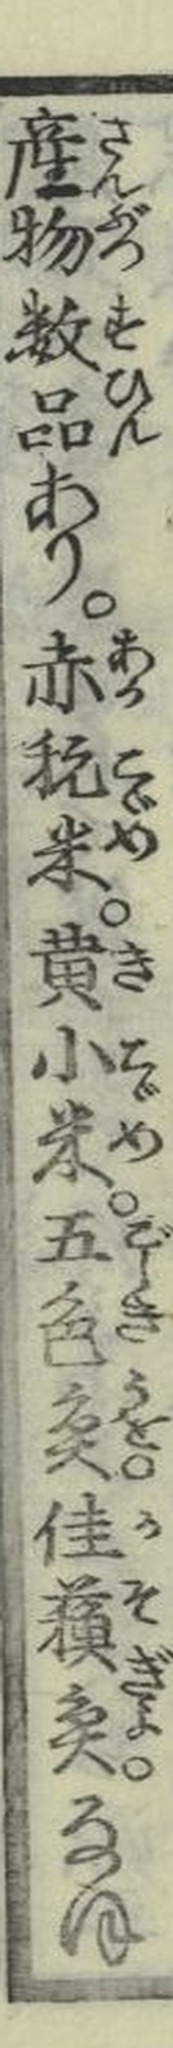産物数品あり。赤秔米。黄小米。五色魚。佳蘓魚。なほ
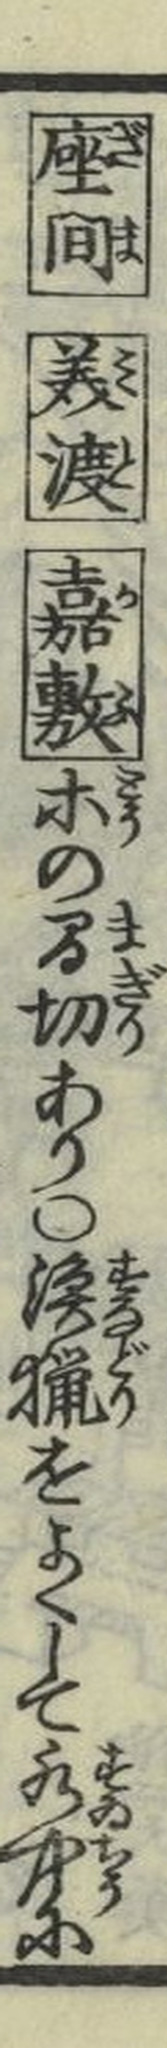𫝶間美渡嘉敷等の間切あり〇漁猟をよくして水中に

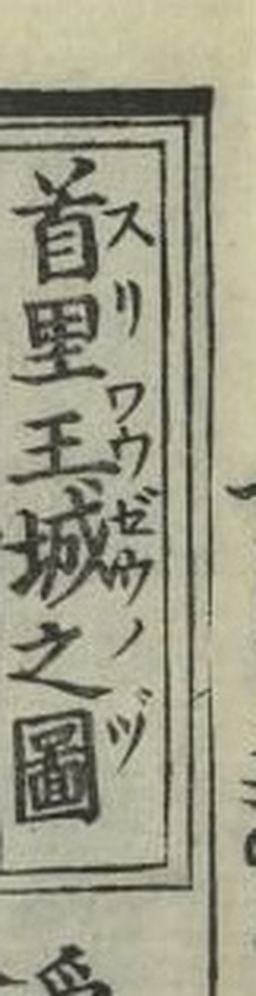首里王城之圖
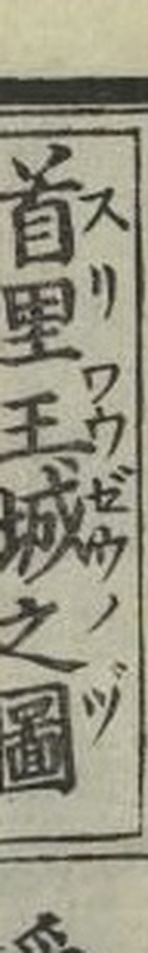首里王城之圖
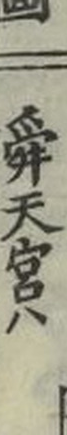舜天宮ハ
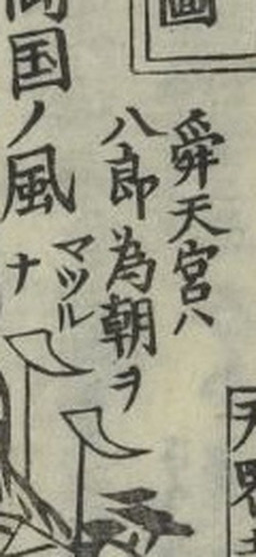八郎為朝を
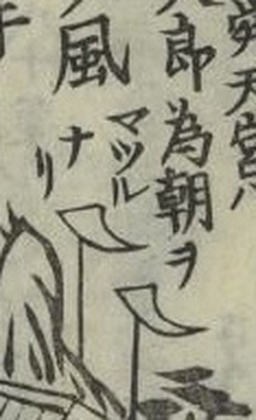マツル
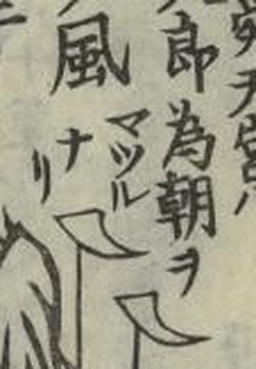マツル
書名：琉球奇譚
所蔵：University of the Ryukyus Library
